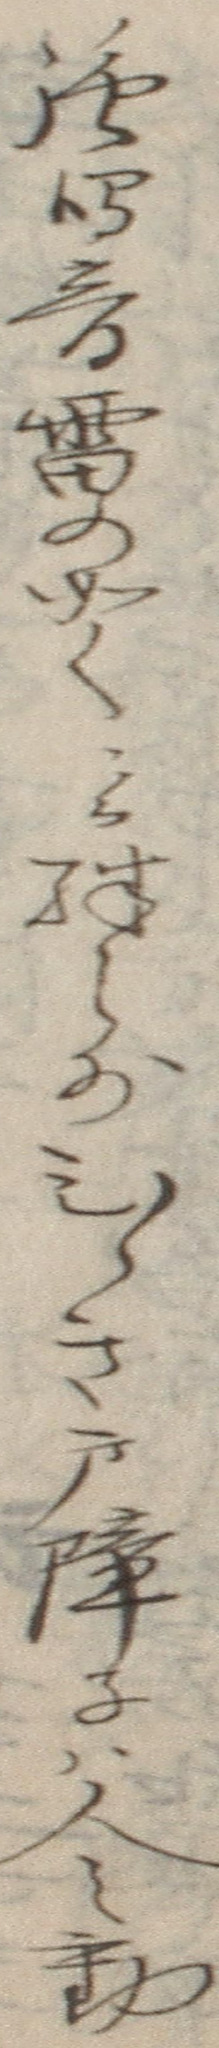強鳴音雷の如くニ而殊之外ひらき戸障子ハ人之動
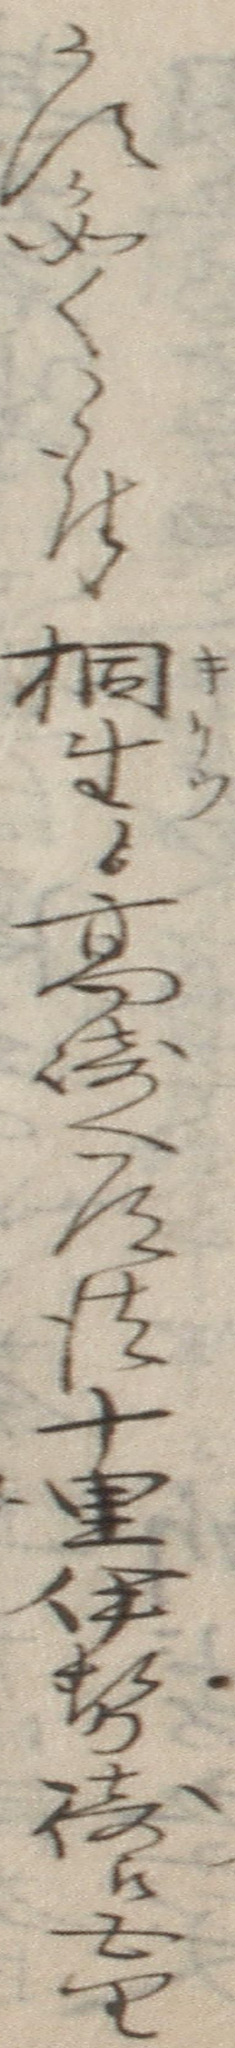ニすら如く御座候桐生ゟ高崎へ道法十里伊勢崎え五里
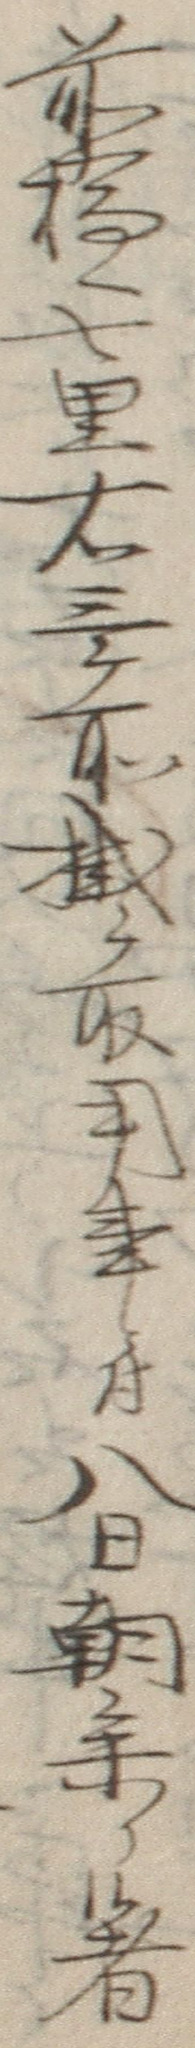前橋へ七里右三ケ所掛ケ取用事ニ付八日朝参り候者
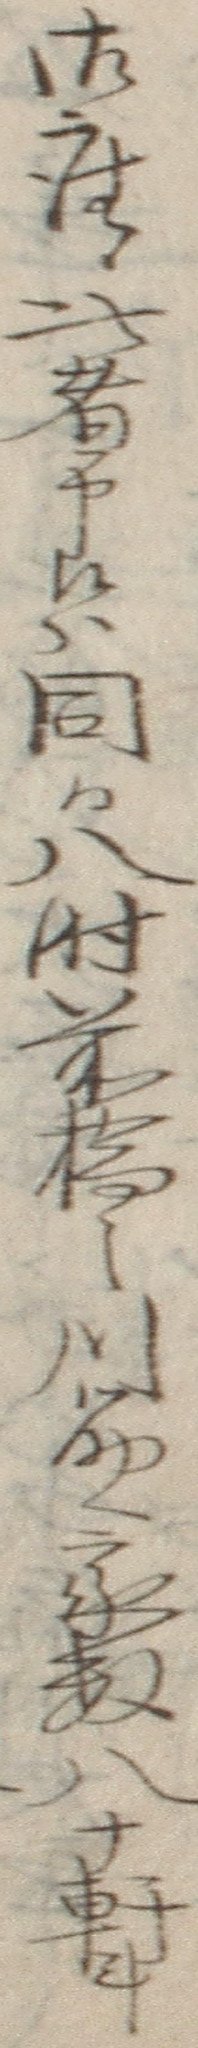御座候此者申候ハ同日八時前橋之川筋へ家数八十軒斗
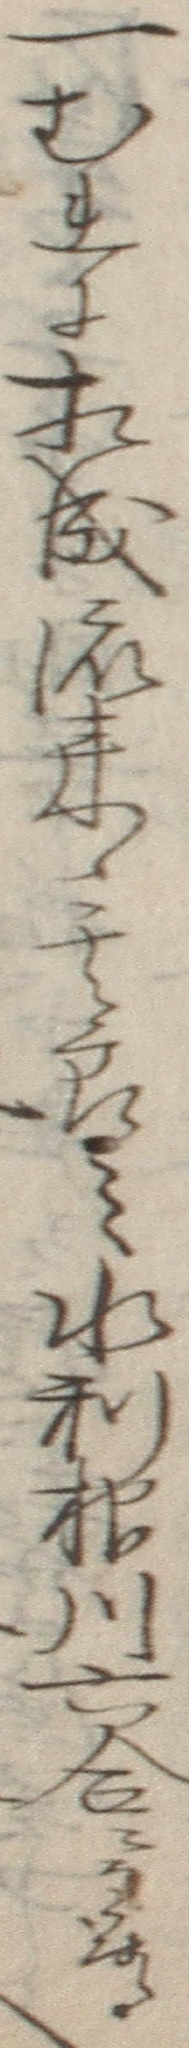一むれに相成流来候其節之水利根川六合ニ而御座候
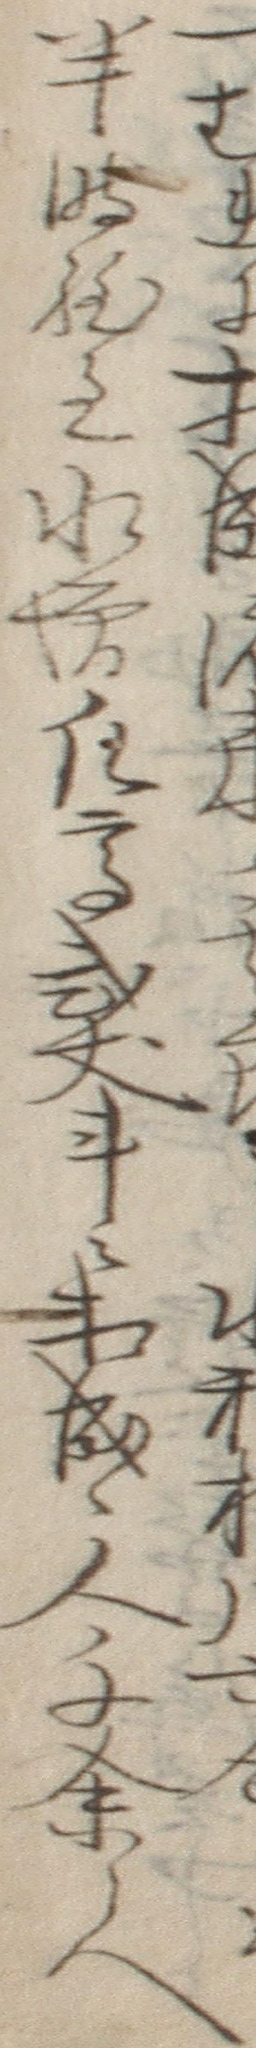半時程過水増凡高弐丈斗ニ相成候人千余人

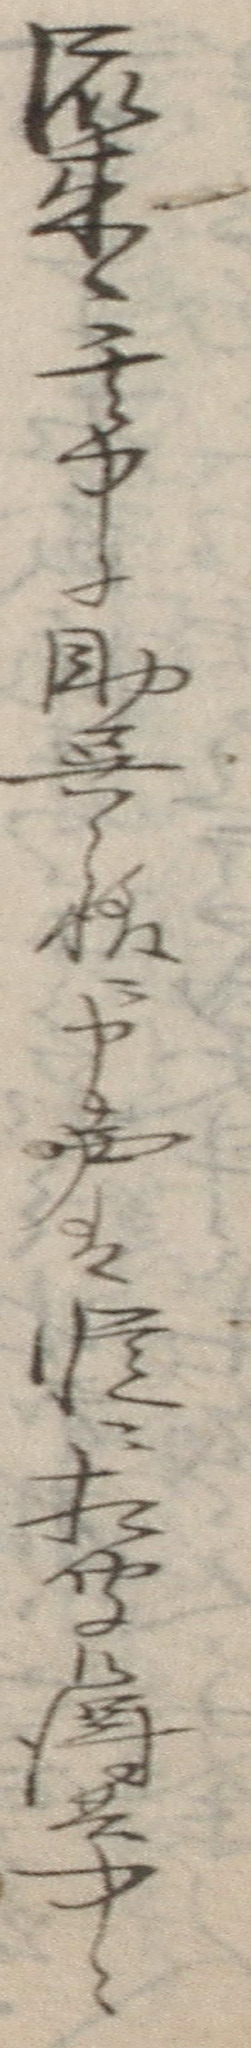流来候其中に助呉候様ニ申声は慥に相聞候得共中々
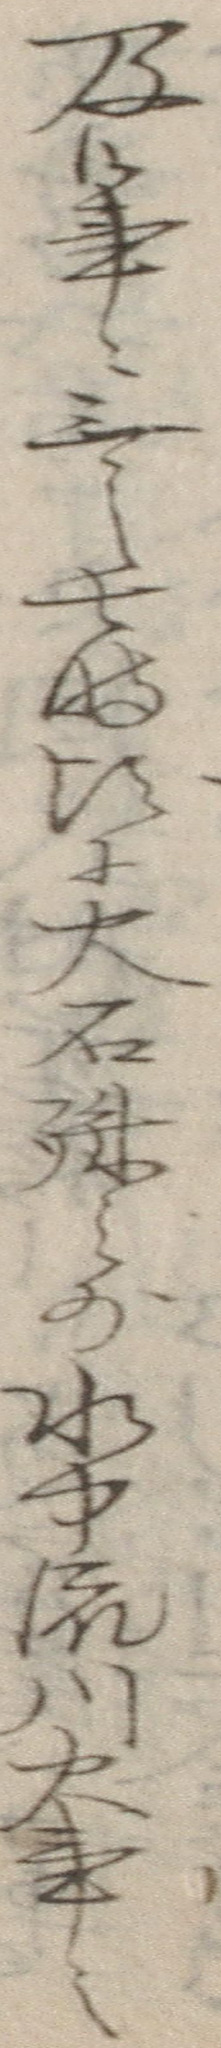及候事ニ無之七時頃に火石殊之外水中流川火事之
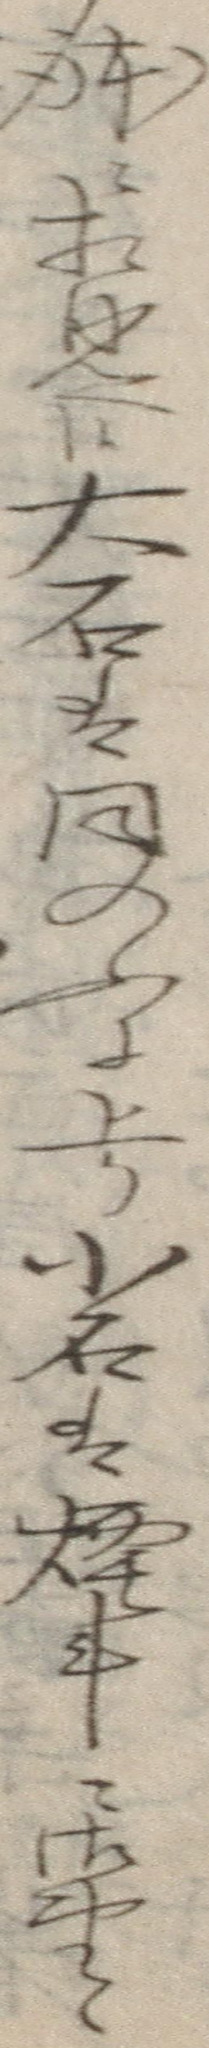躰ニ相見へ候大石はほのふに上り小石は煙斗ニ御座候
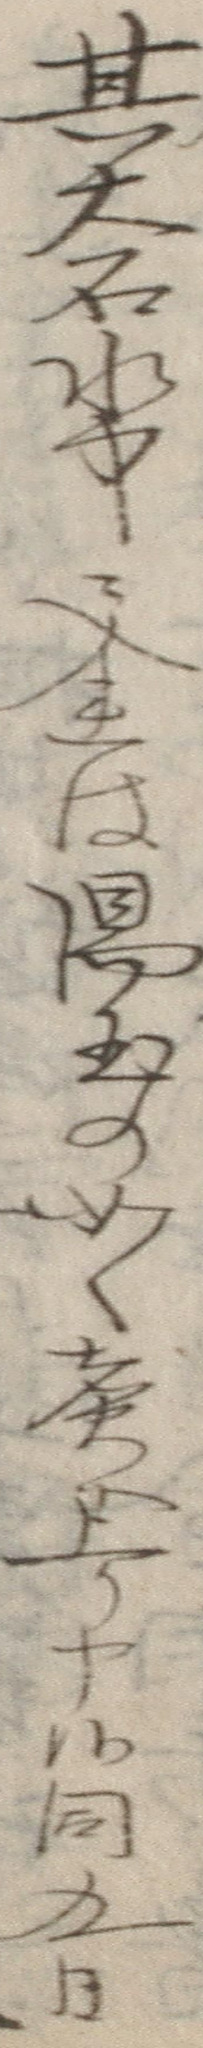其大石水中ニいれは湯玉の如く煮へ上り申候同九日
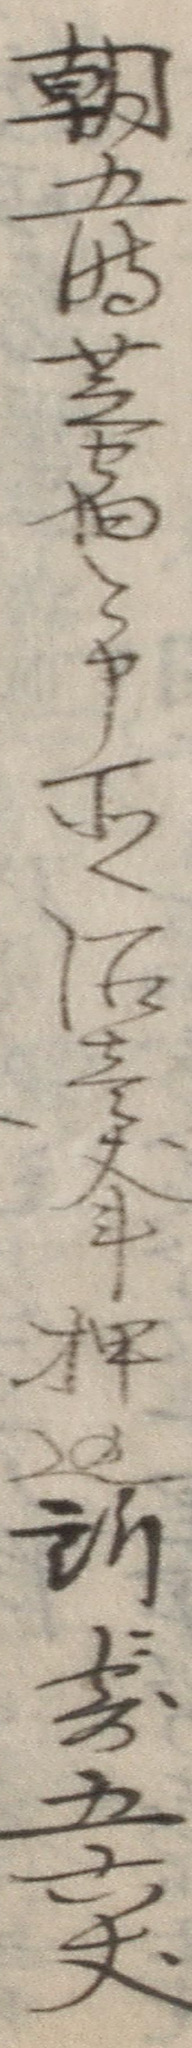朝五時芝宿と申所へ泥壱丈斗押込所ニ寄五六丈
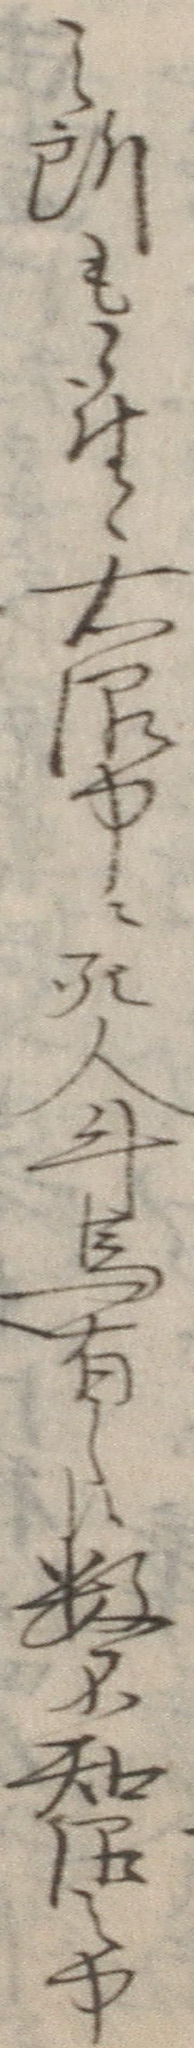之所も御座候右泥中ニ死人牛馬有之候数不知沼之中
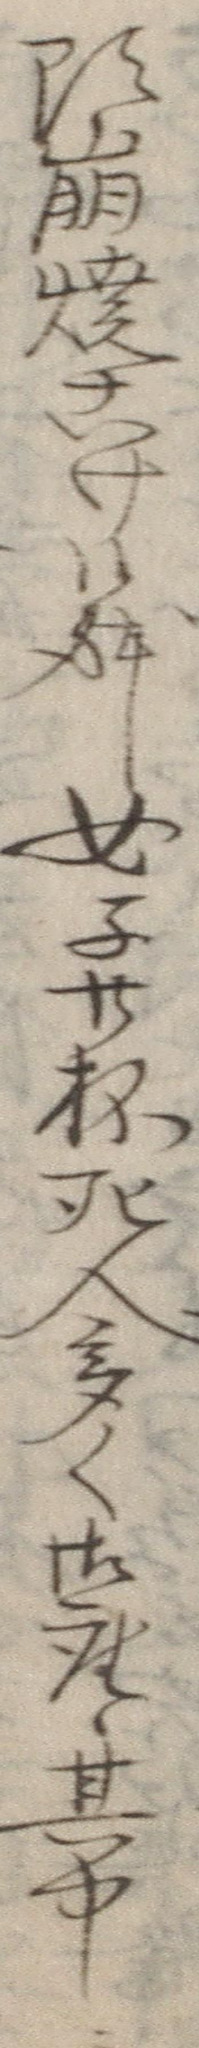頭崩焼こけ候躰之女子共抔死人多く御座候其中
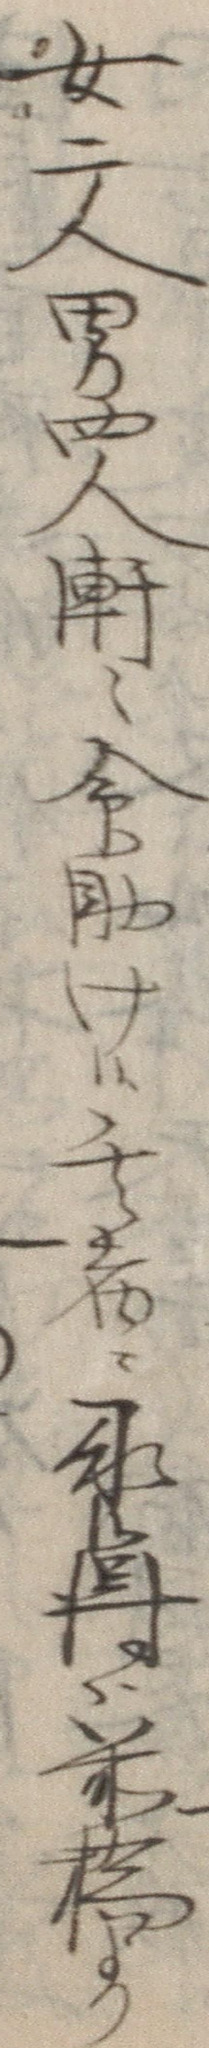女二人男四人漸々命助け候其者ニ承候得ハ前橋より
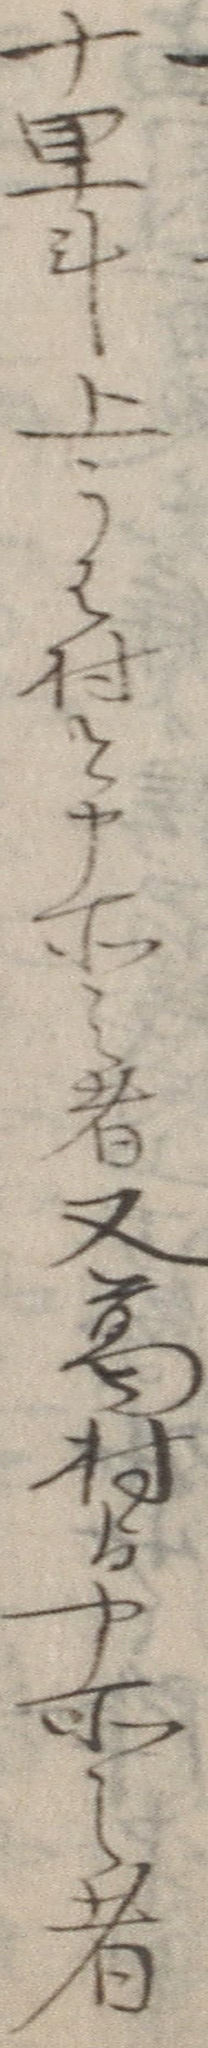十里斗上かわ村と申所之者又葛村と申所之者
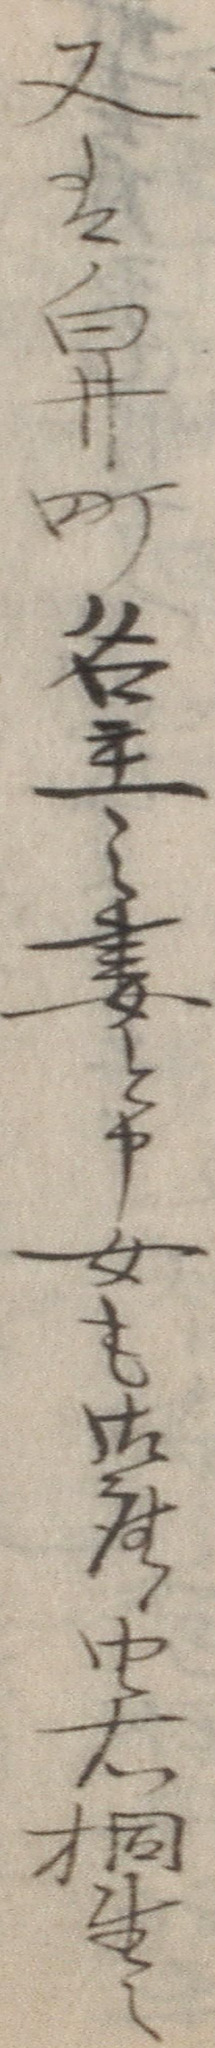又は白井町名主之妻と申女も御座候由右桐生之
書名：[諸国災害記録]
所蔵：東京大学地震研究所図書室 Earthquake Research Institute Library, The University of Tokyo, JAPAN
